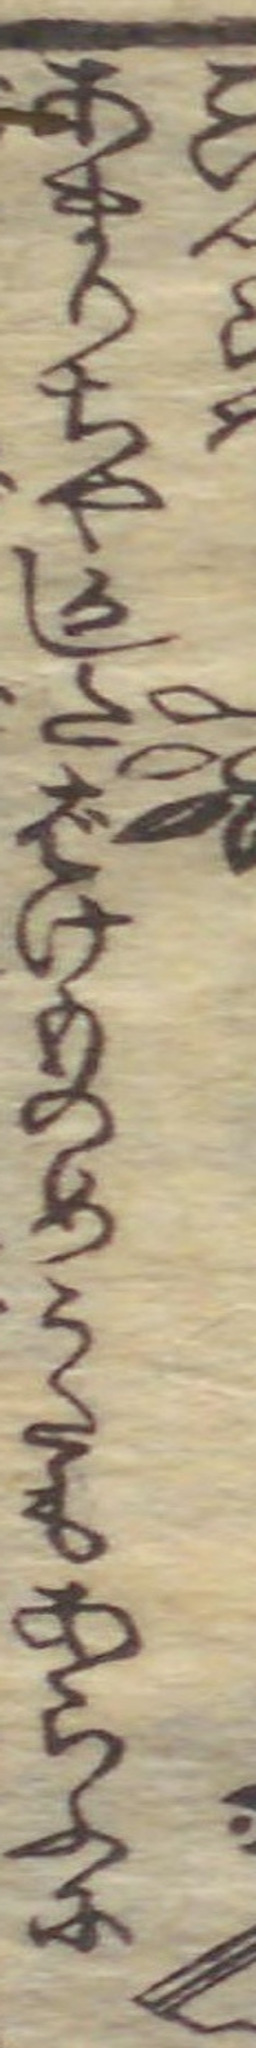あまりちやかしたばけものめうたもあらふに
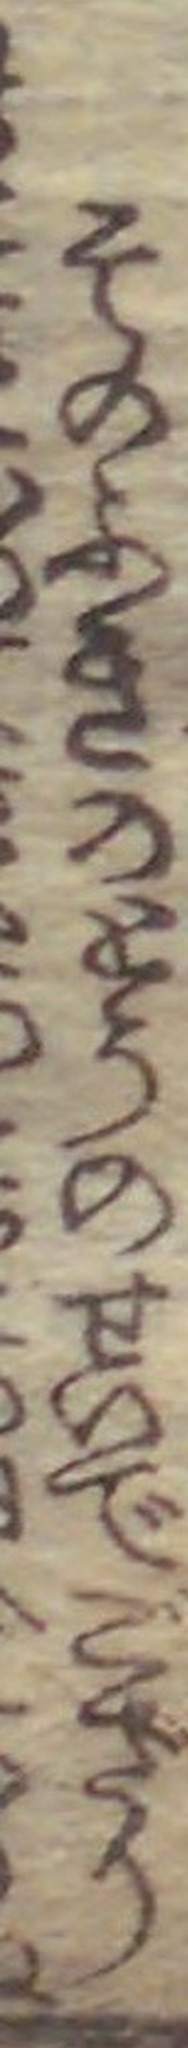そのふきのとうのせいでござり
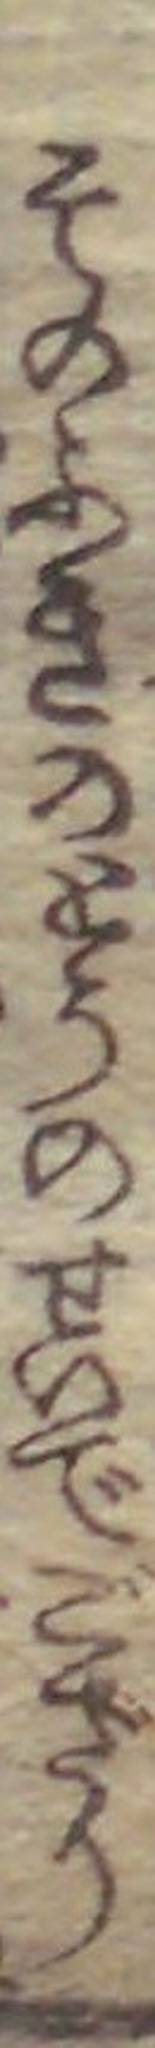そのふきのとうのせいでござり
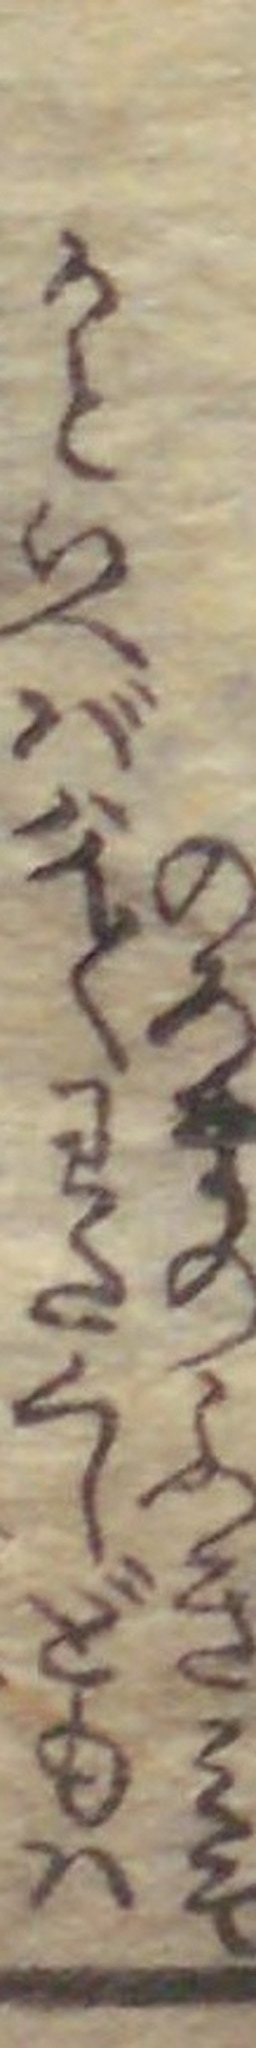かといへばハイ〳〵わたくしどもは
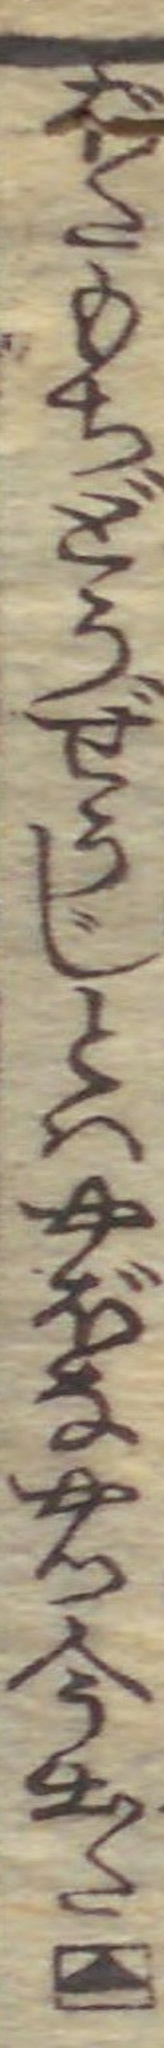ぼたもちどうぜうしとはやぼなやつ今出た◆
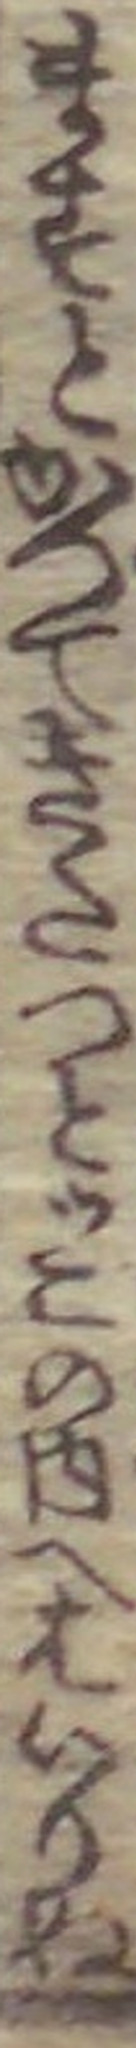ますとかつてきたつとつこの内へはいりぬ

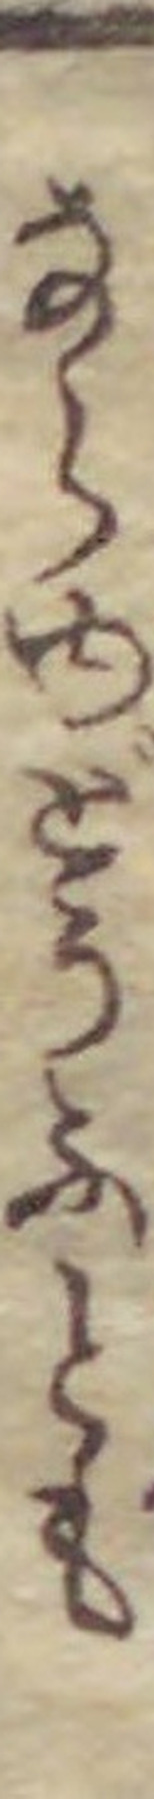ならゆどうふとも
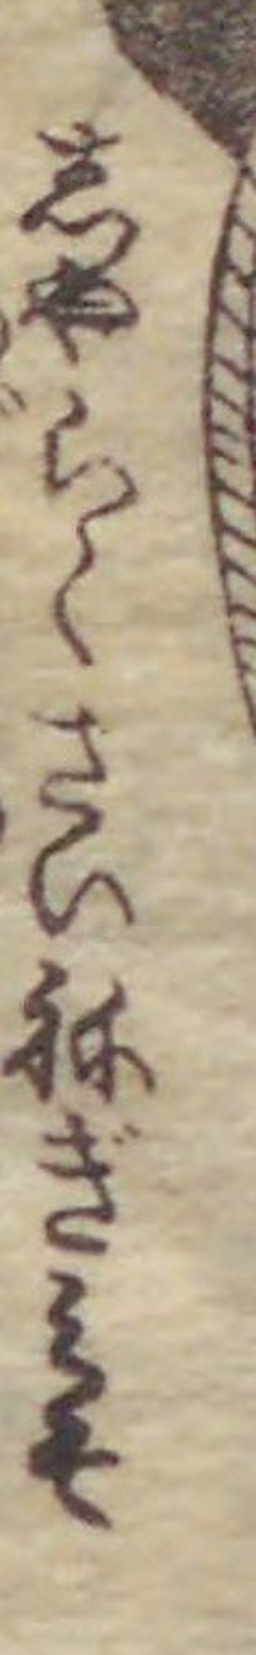しやらくさいねぎみそ
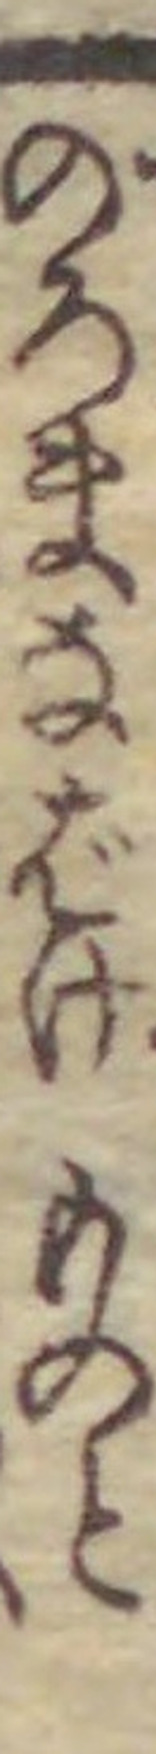のろまなばけものと
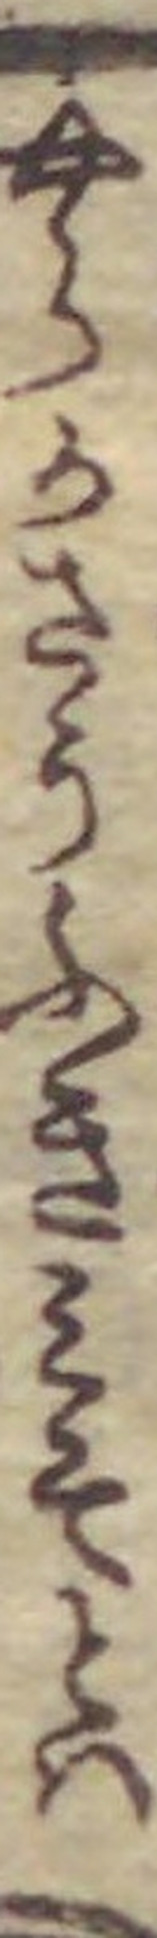やらかさうふきみそとは
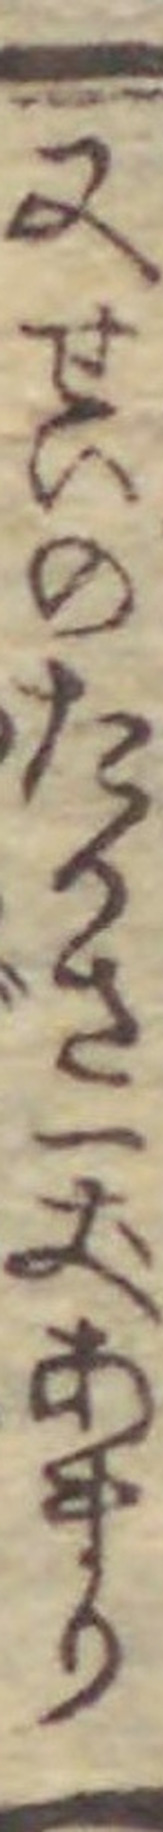又せいのたかさ一丈あまり
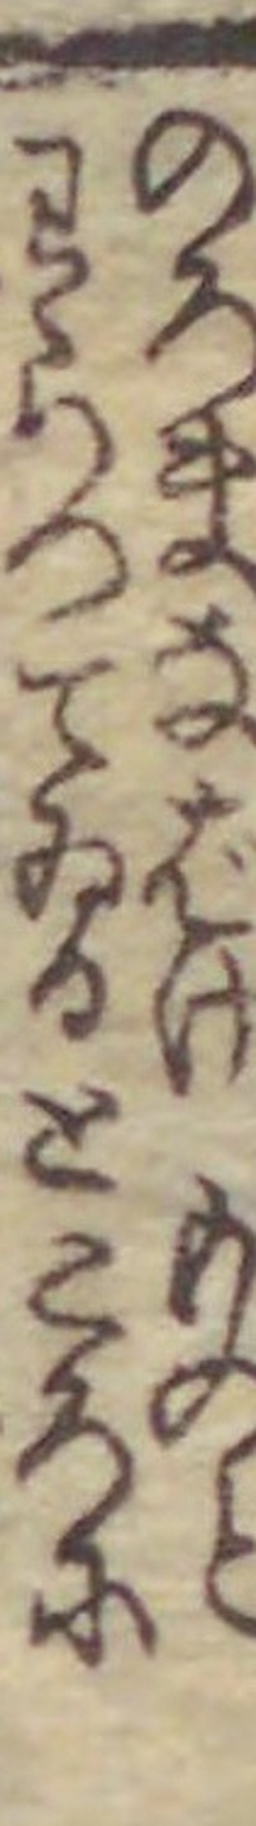わらつてゐるところに
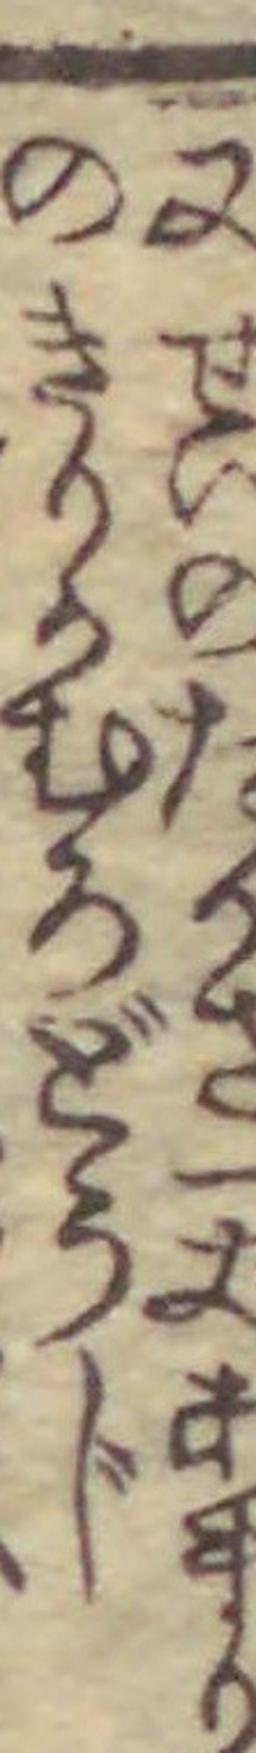のきりかむろどうじ
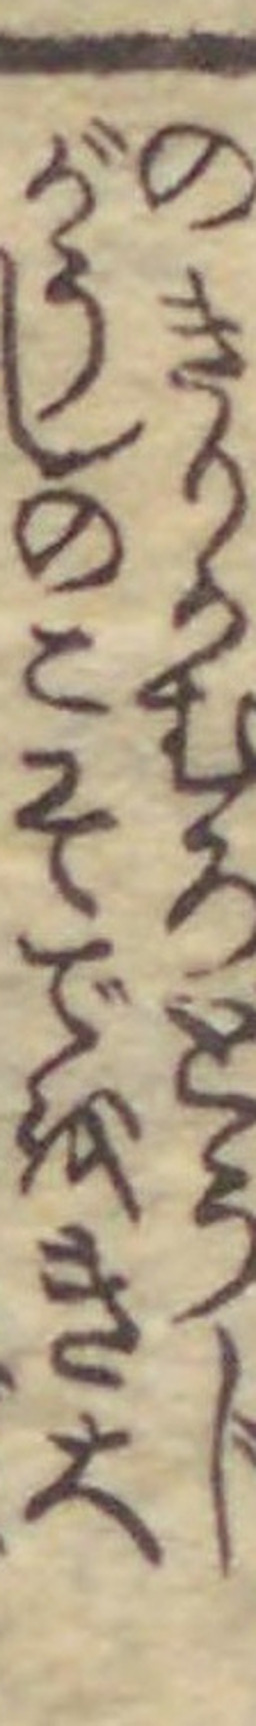がうしのこそでをき大
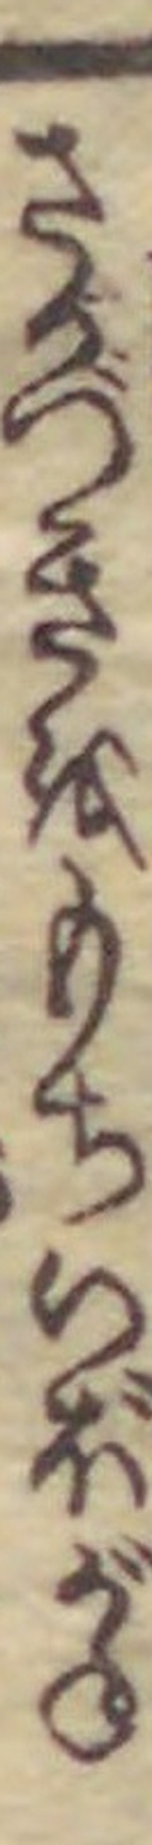さかづきをもちいぼがね
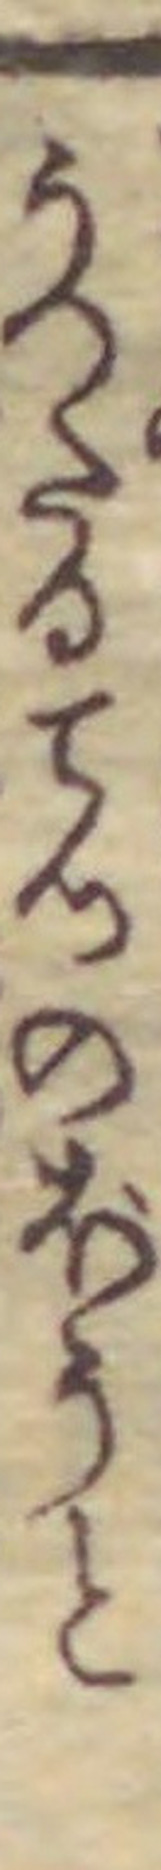うつたるてつのぼうと
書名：大時代唐土化物 3巻. 曽我太夫染
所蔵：国立国会図書館 National Diet Library, JAPAN
